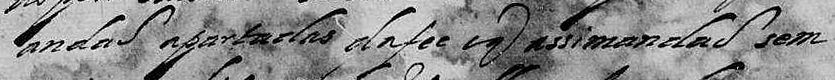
andaõ apartadas da fee e q̄ assi mandaõ sem
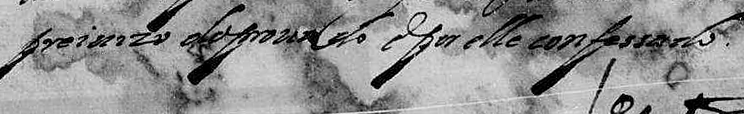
preiuizo de prouado e por elle confessado.
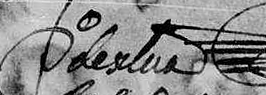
Po de silua
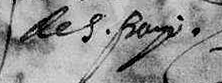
de s. payo.
